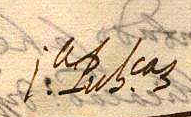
i.a Pub.caz
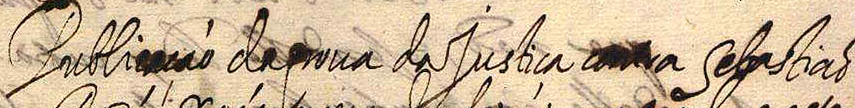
Publicaçaõ da proua da Justiça contra Sebastiaõ
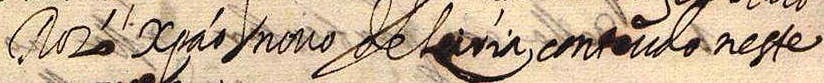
Roz̄ Xpaõ nouo de Leiria conteudo neste
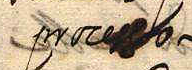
processo
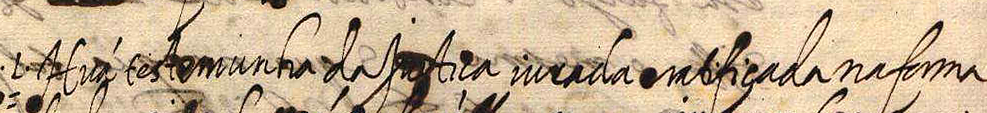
.1. Huā testemunha da Justiça iurada e ratificada na forma
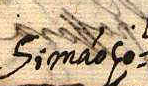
Simaõ go
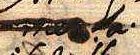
me_ ta.
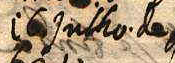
i6 Julho. de
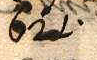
621.
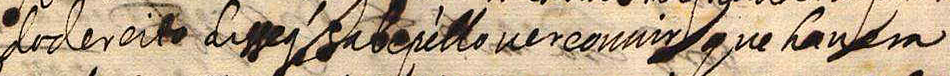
do dereito disse q̄ sabe pello uer e ouuir que hauera
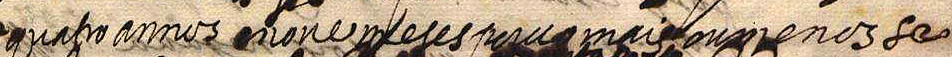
quatro annos e noue meses pouco mais ou menos se
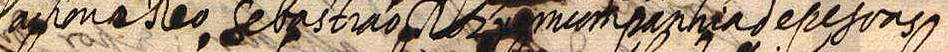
achou o Reo sebastiaõ Roz̄ em companhia de pesoas
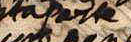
_ta parte
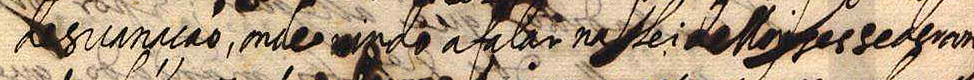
de sua naçaõ, onde uindo a falar na Lei de Moyses se deram
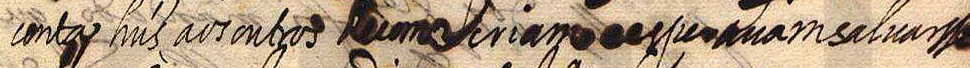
conta hūs aos outros de como seriam e esperauam saluarsse
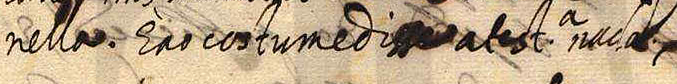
nella. E ao costume disse a test.a nada.
